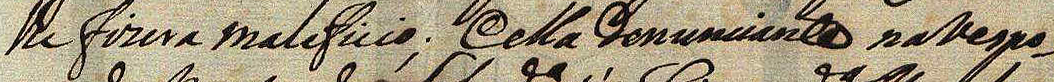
lhe fizera maleficio; e ella denunciante na vespo
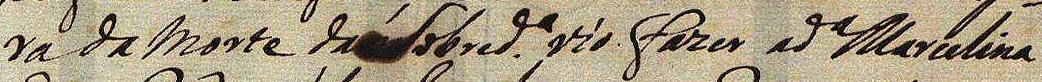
ra da morte da Sobred.a vio fazer a da Marcelina
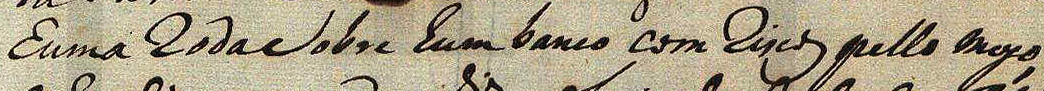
huma Roda Sobre hum banco com Riscos pello meyo,
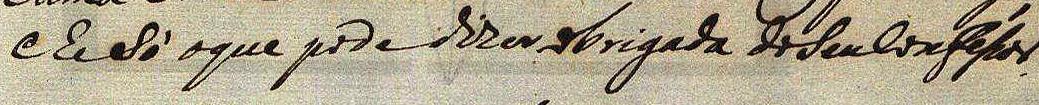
e he só o que pode dizer obrigada do Seu Confessor
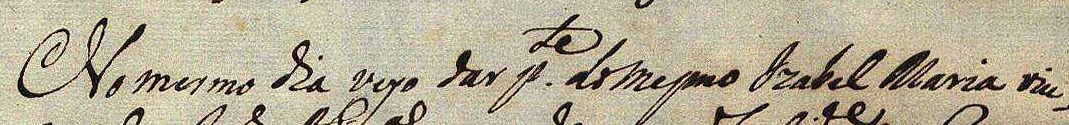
No mesmo dia veyo dar p.te do mesmo Izabel Maria viu
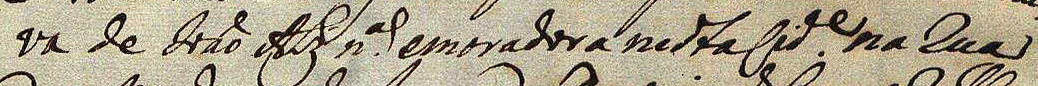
va de Ioão Alz̄ n.al e moradora nesta Cid.e na Rua
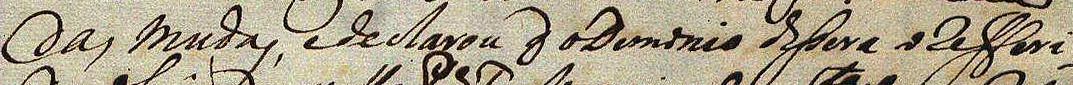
das mudas, e declarou q̄ o Demonio dissera o Refferi
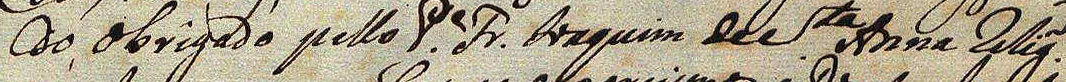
do, obrigado pello P.e Fr. Ioaquim de S.ta Anna Reliḡ.
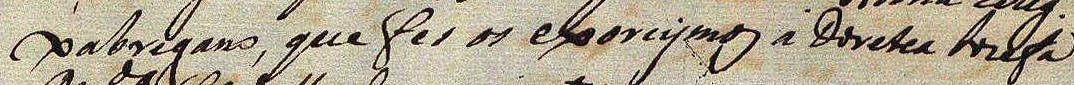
xabregano, que fes os exorcismos à Doretea Iozefa
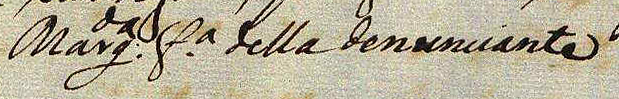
Marg.da f.a della denunciante
